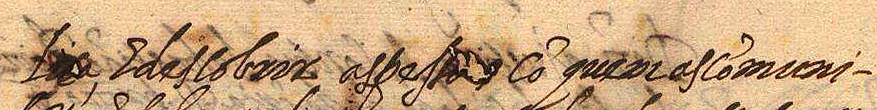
Lica, E descobrir as passoas cō quem as cōmuni
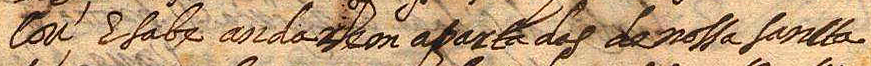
cou, E sabe andarem apartadas de nossa sancta
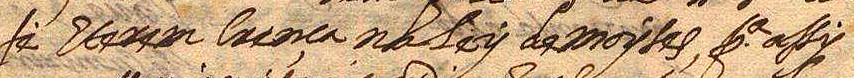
fé E terem crença na Ley de moyses, p.a assy
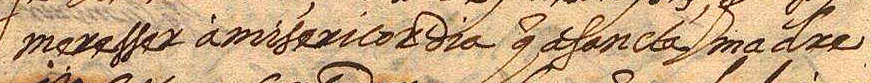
meresser a misericordia q̄ a sancta madre
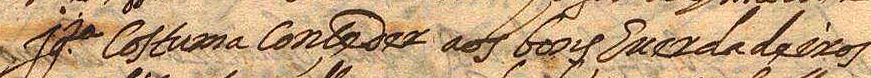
jg.ia costuma conçeder aos bons E uerdadeiros
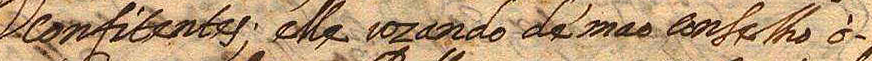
confitentes; elle uzando da mao conselho o
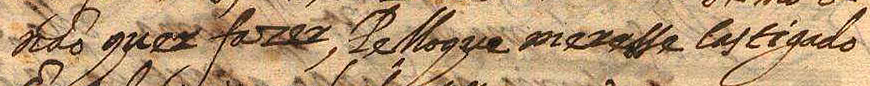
naõ quer fazer, Pello que meresse castigado
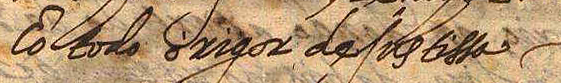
cō todo o rigor de justissa
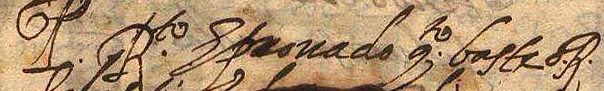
P. R.to E prouado q.to baste o .R.
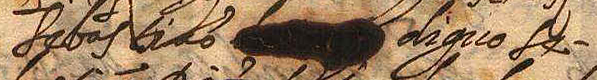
sebastiaõ _ diguo se
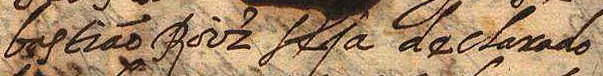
bastiaõ Roiz̄ seja declarado
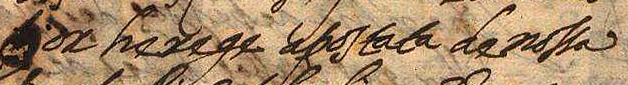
por herege apostata de nossa
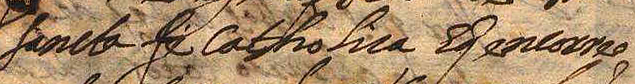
sancta fé catholica, E q̄ encorreo
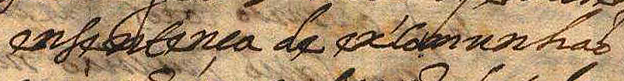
en sentença de excomunhaõ
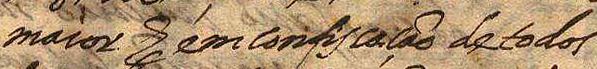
maior E em confiscação de todos
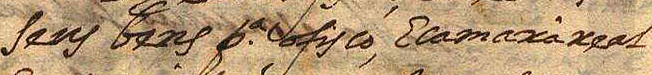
seus bens p.a o fisco, E camara real
